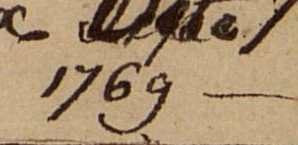1769-
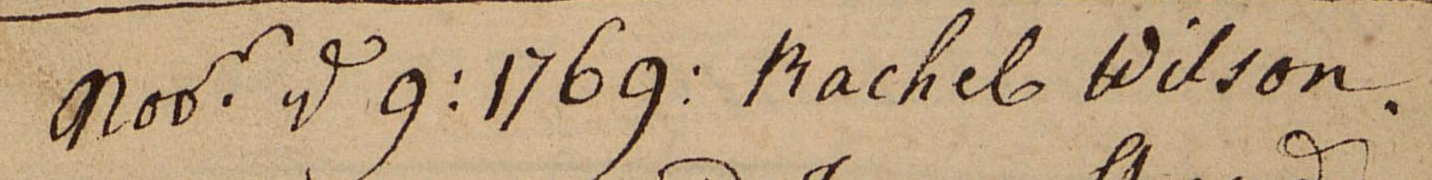Nov^r y^e 9: 1769: Rachel Wilson.
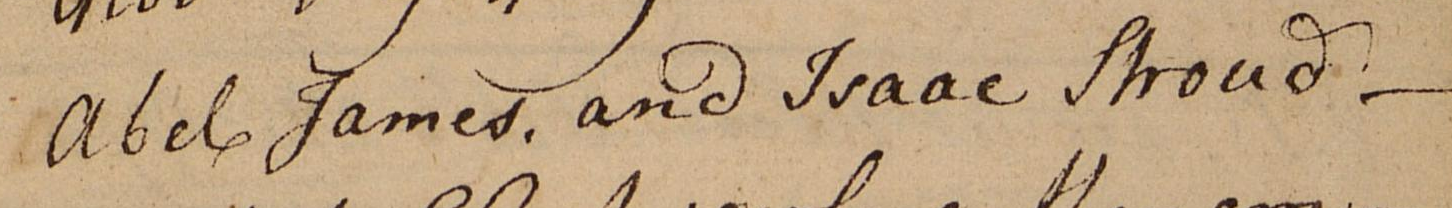Abel James, and Isaac Stroud-
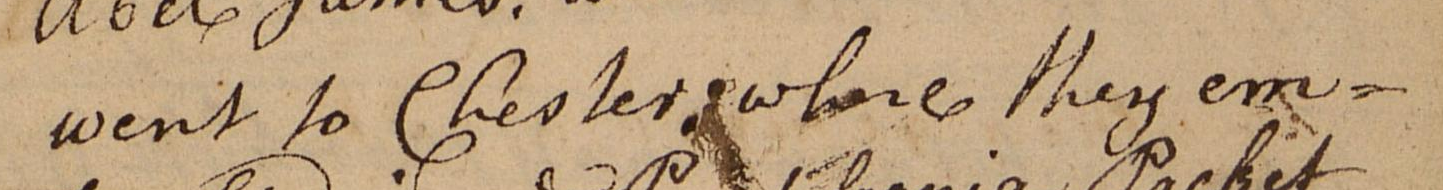went to Chester: where they em-
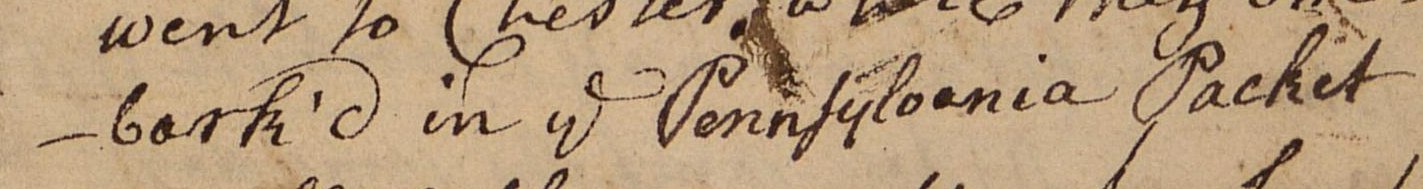-bark'd in y^e Pennsylvania Packet
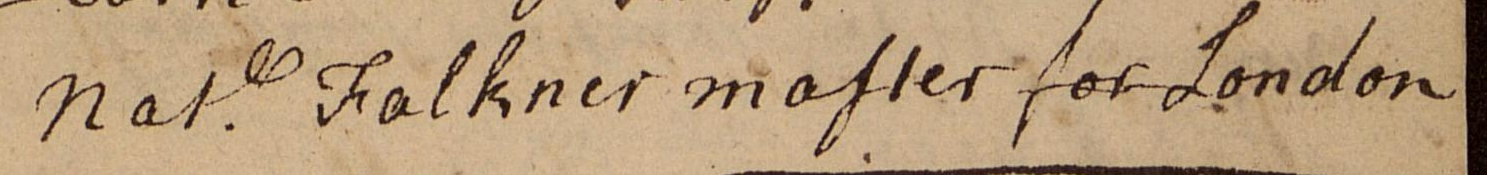Nat^l Falkner master for London
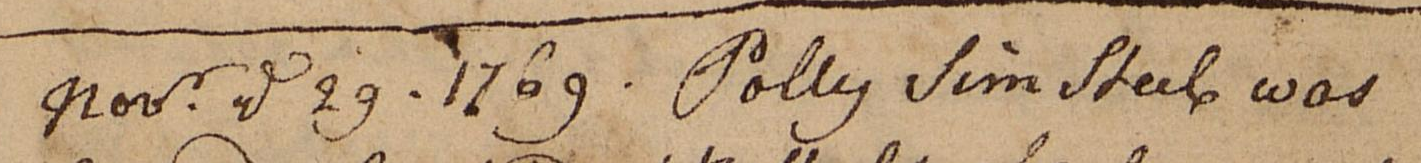Nov^r. y^e 29. 1769. Polly Sim Steel was
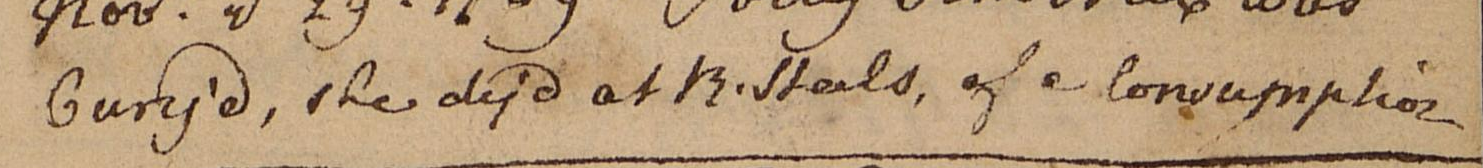bury'd, she dy'd at R. Steals, of a Consumption
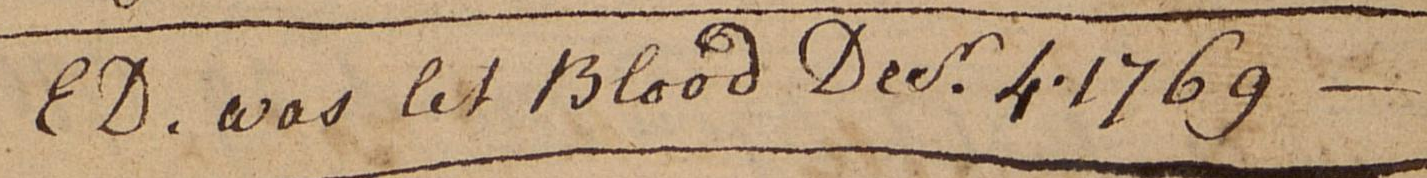ED. was let Blood Dec^r 4. 1769-
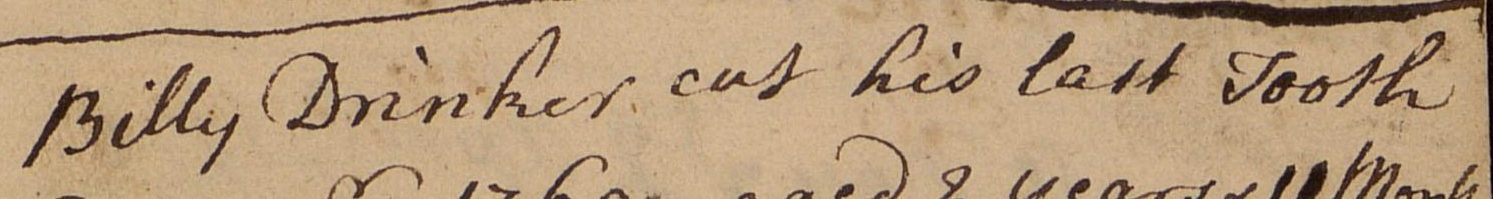Billy Drinker cut his last Tooth
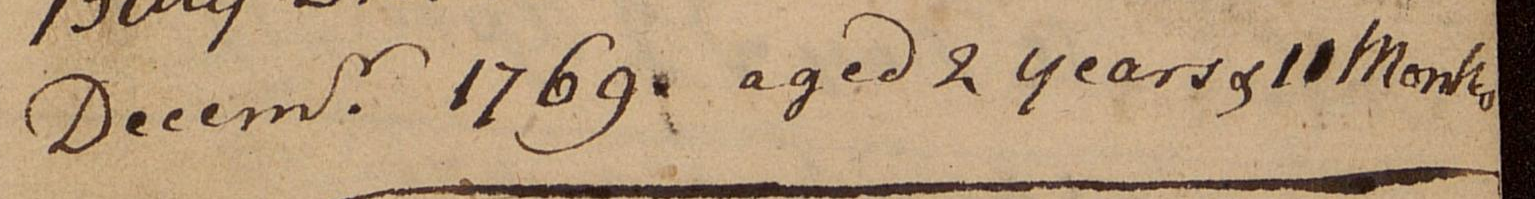Decem^r. 1769. aged 2 years & 11 Months
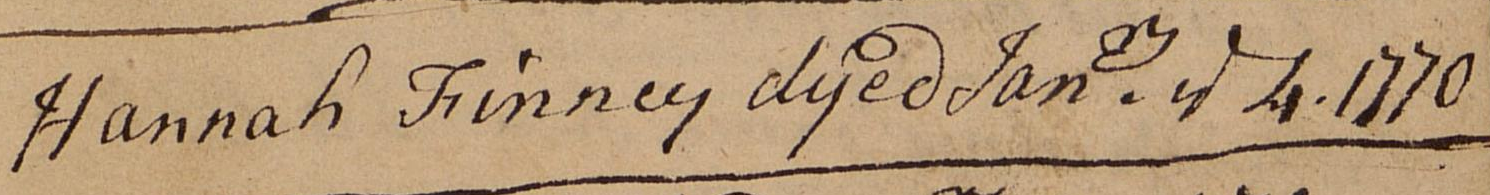Hannah Finney dyed Jan^ry. y^e 4. 1770
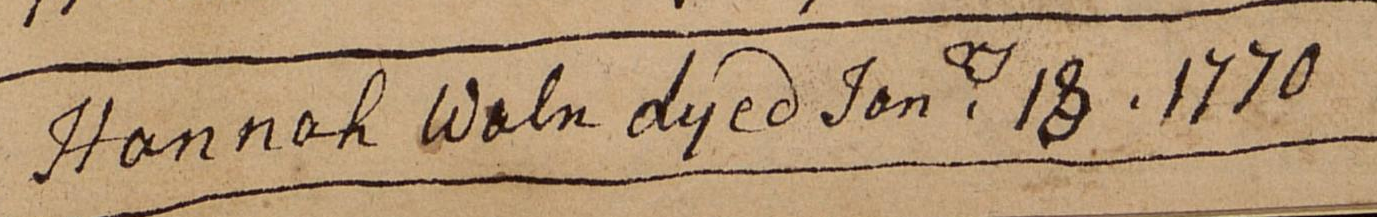Hannah Waln dyed Jan^ry. 18. 1770
